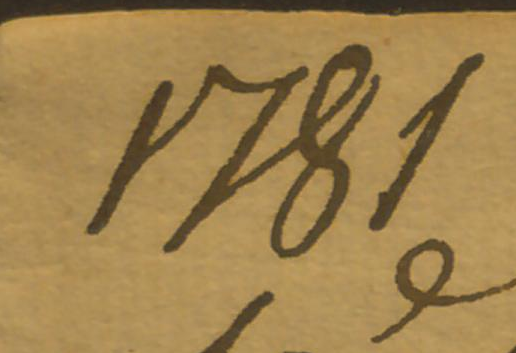1781
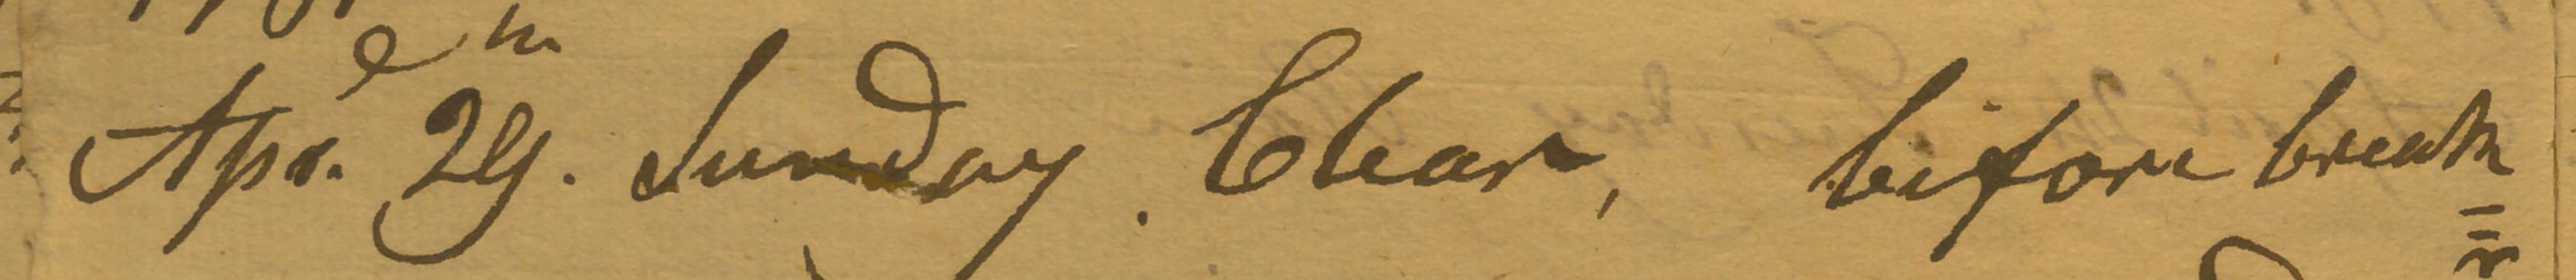Aprl. 29^th. Sunday Clear, before break
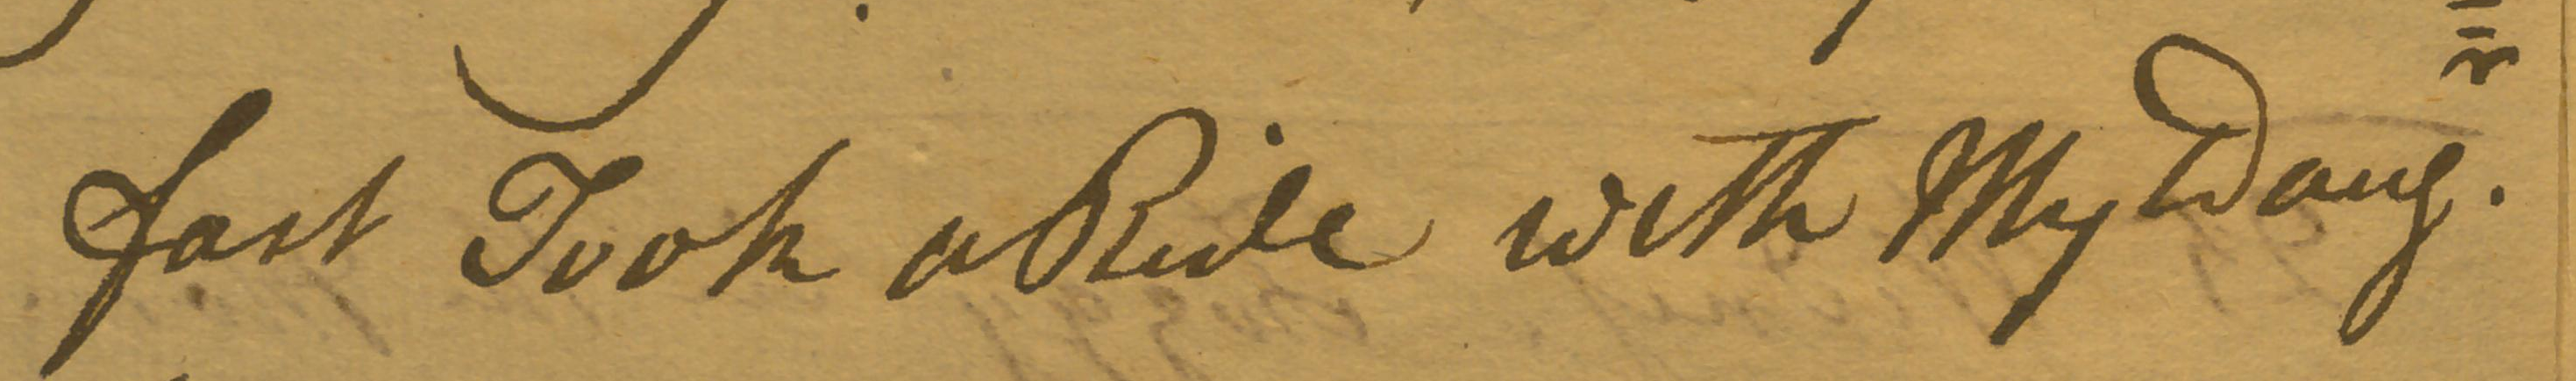fast Took a Ride with My Daug^r.
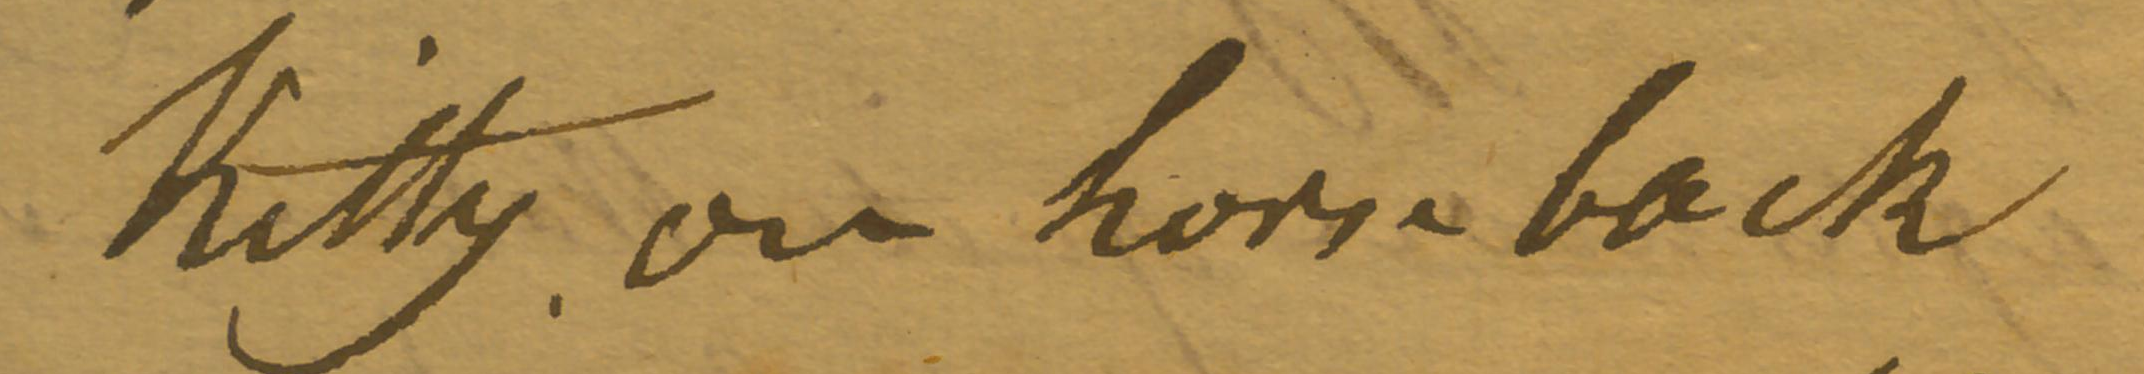Kitty or horse back
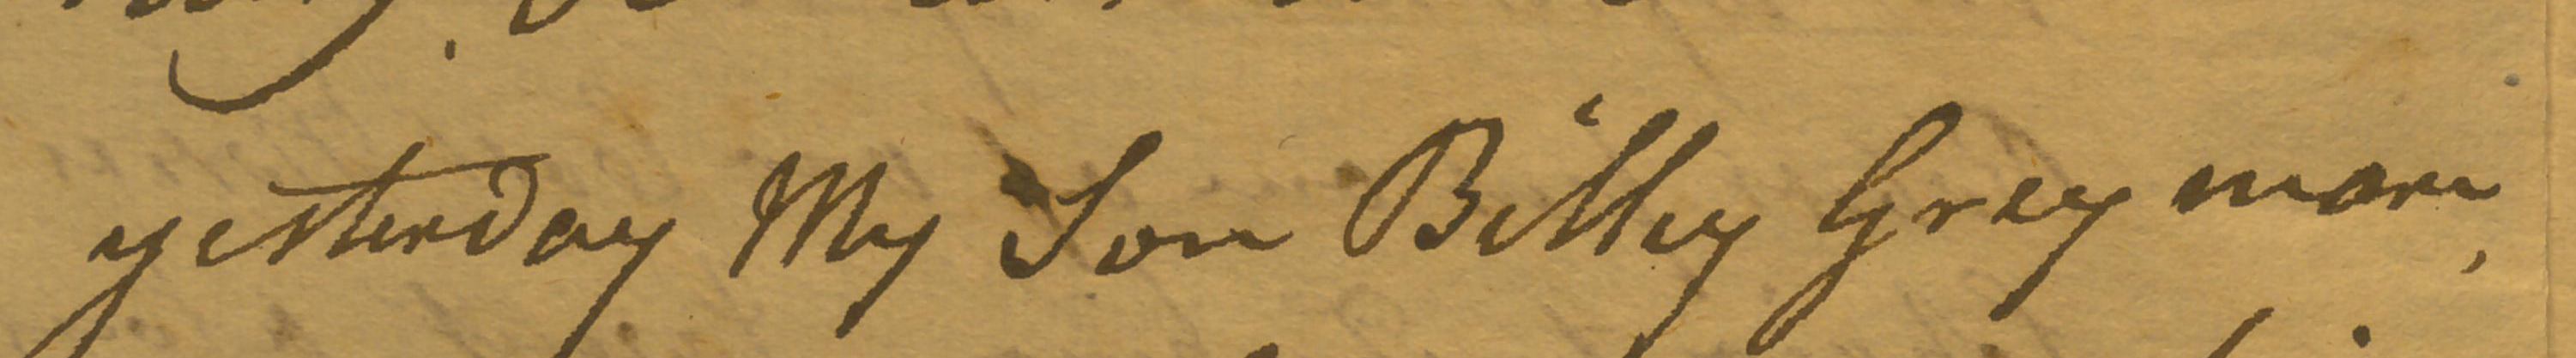yesterday My Son Billey Grey mare
